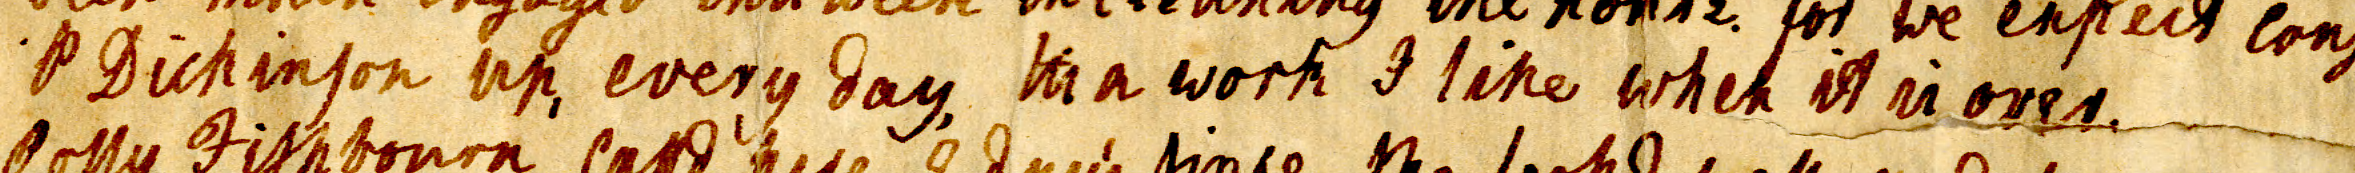P Dickinson up, every day, tis a work I like when it is over.
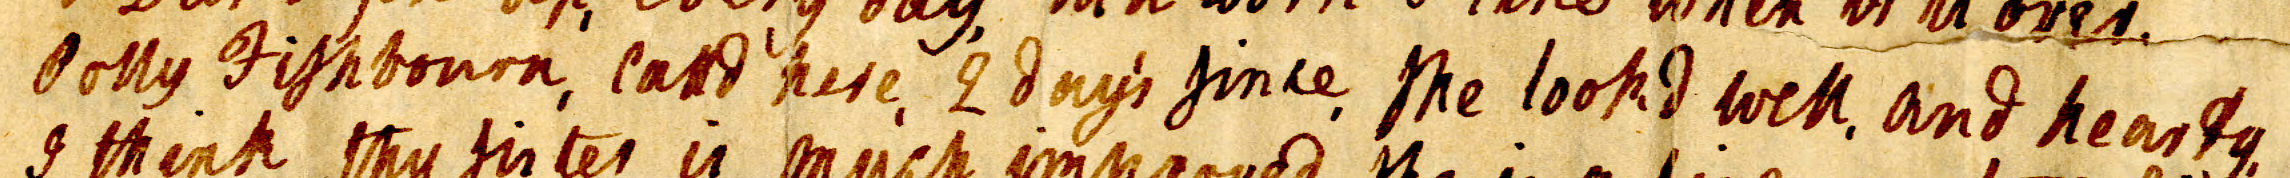Polly Fishbourne calld here 2 day's since. she lookd well. and hearty,
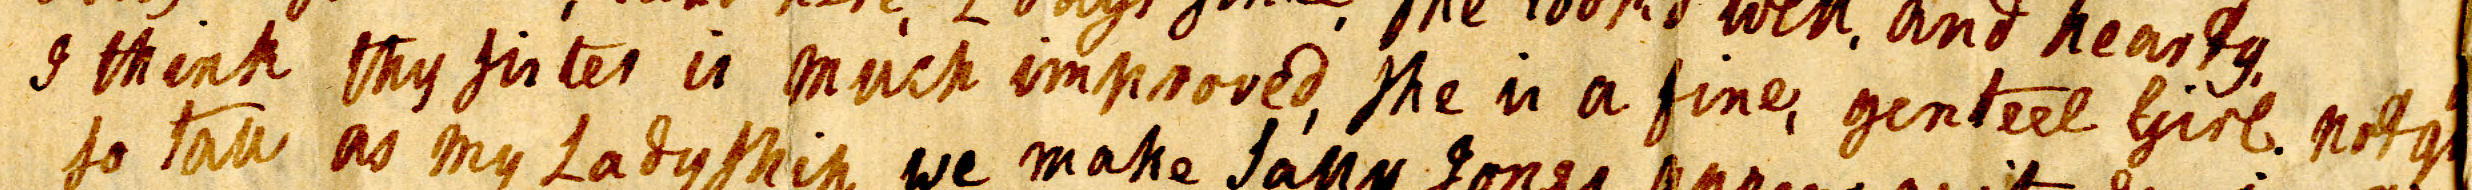I think thy sister is much improved, she is a fine genteel Girl. not q
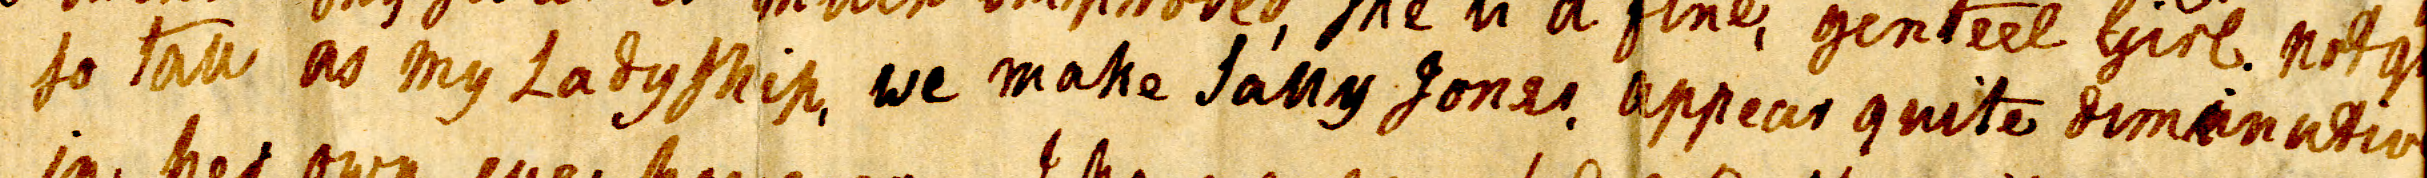so tall as my Ladyship, we make Sally Jones appear quite diminutiv
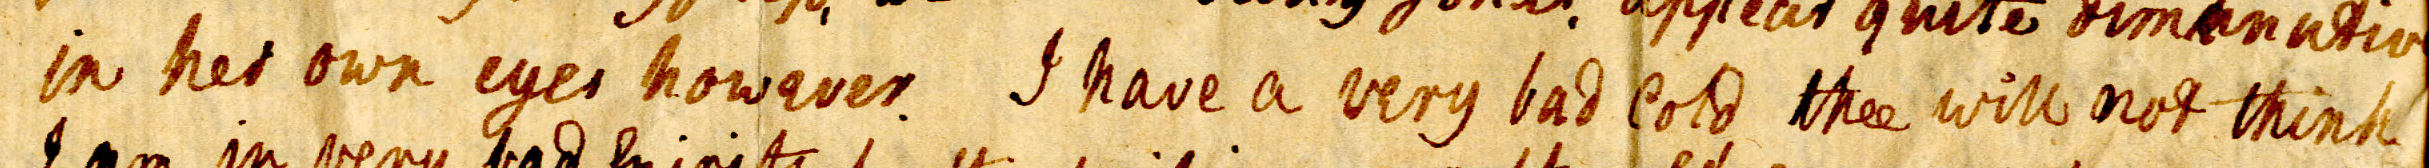in her own eyes however. I have a very bad cold thee will not think
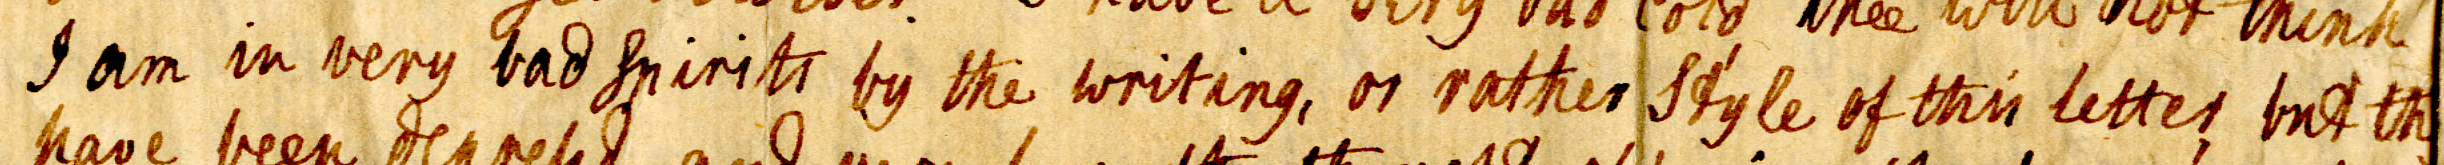I am in very bad spirits by the writing, or rather style of this letter but thy
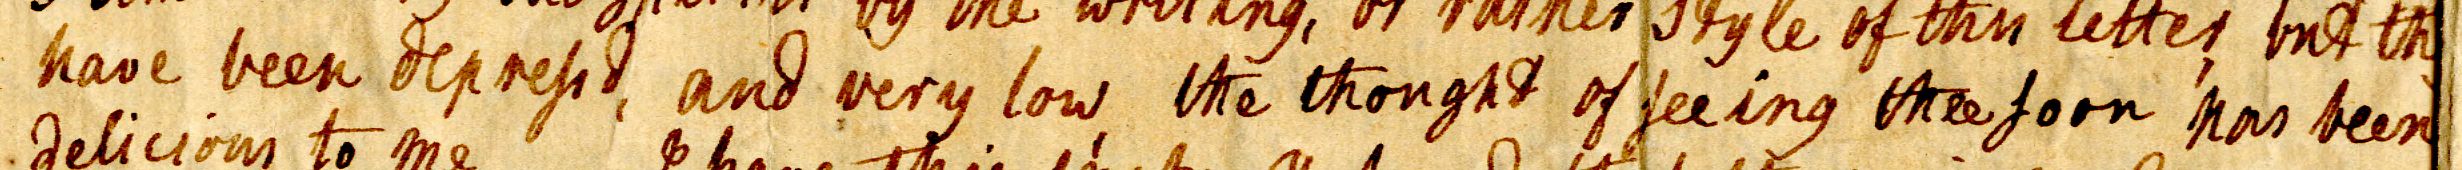have been depressd and very low, the thought of seeing thee soon has been
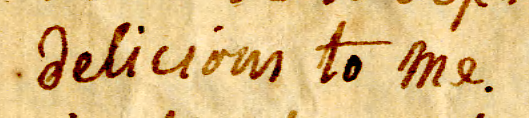delicious to me.
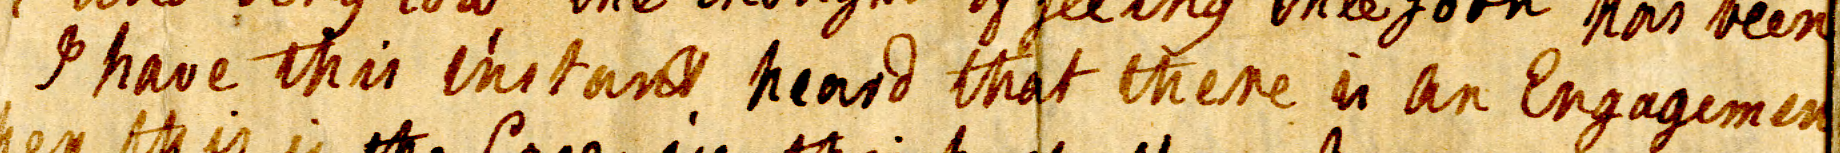I have this instant heard that there is an Engagement
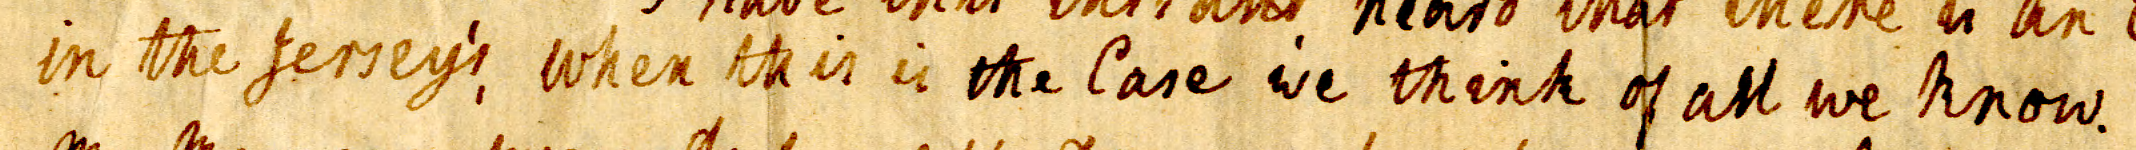In the Jersey's when this is the Case we think of all we know.
